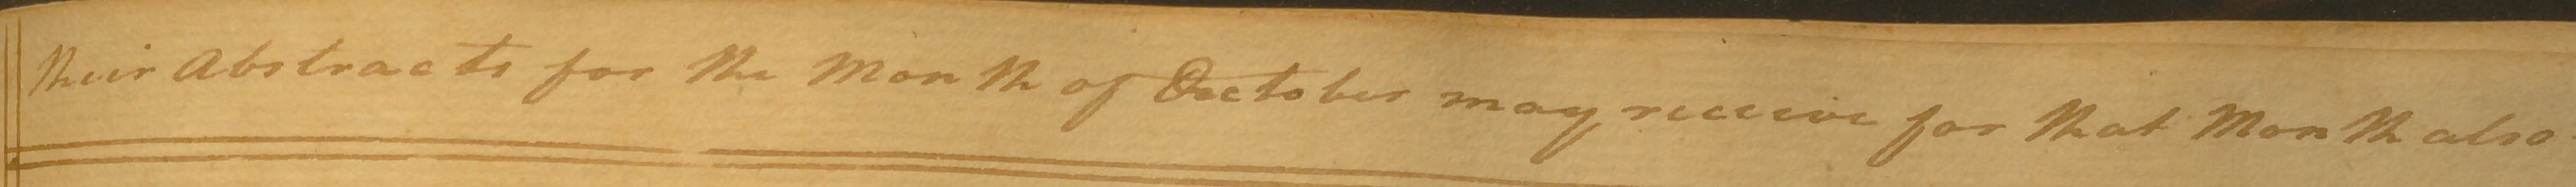their Abstracts for the Month of October may receive for that Month also
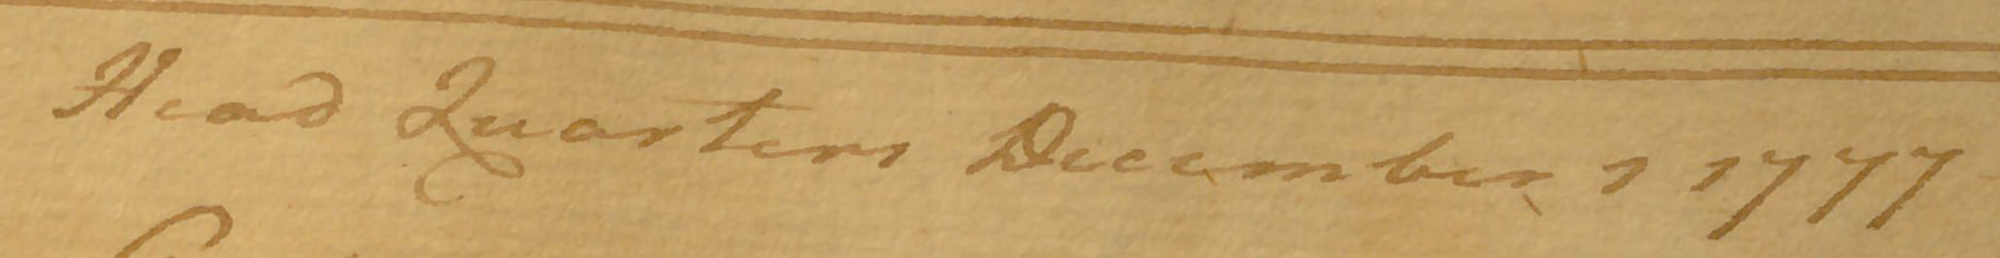Head Quarters December 1 1777
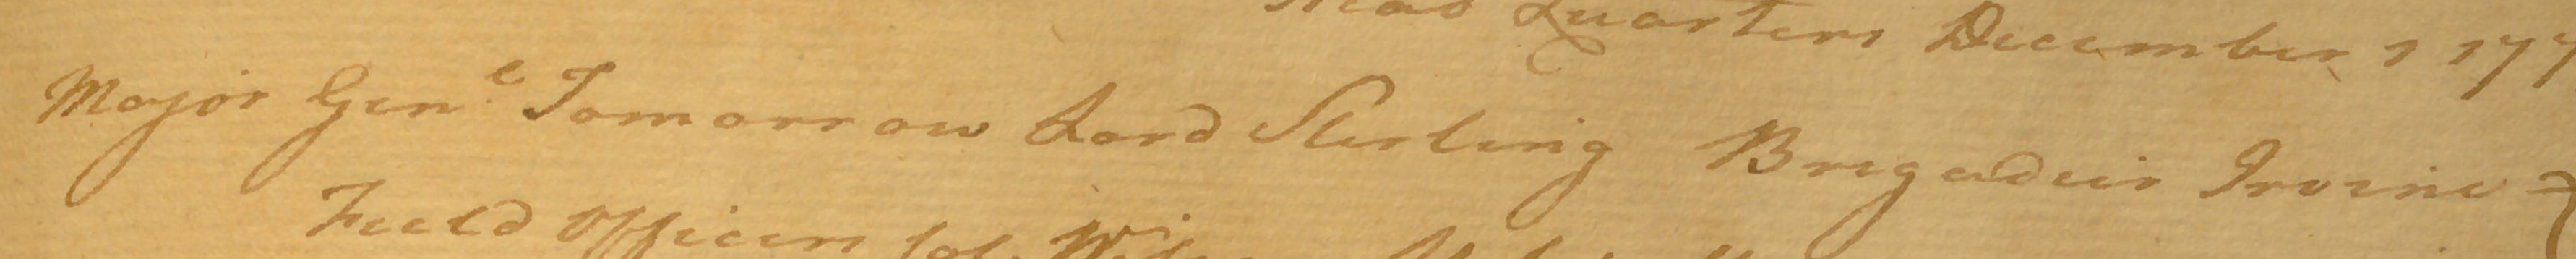Major Gen^l Tomorrow Lord Sterling Brigadier Irvine-
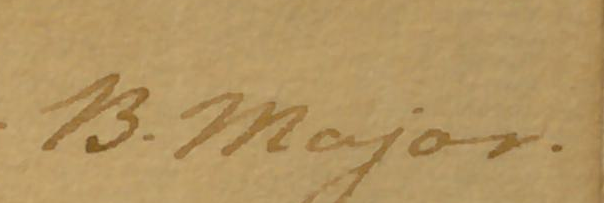B. Major.
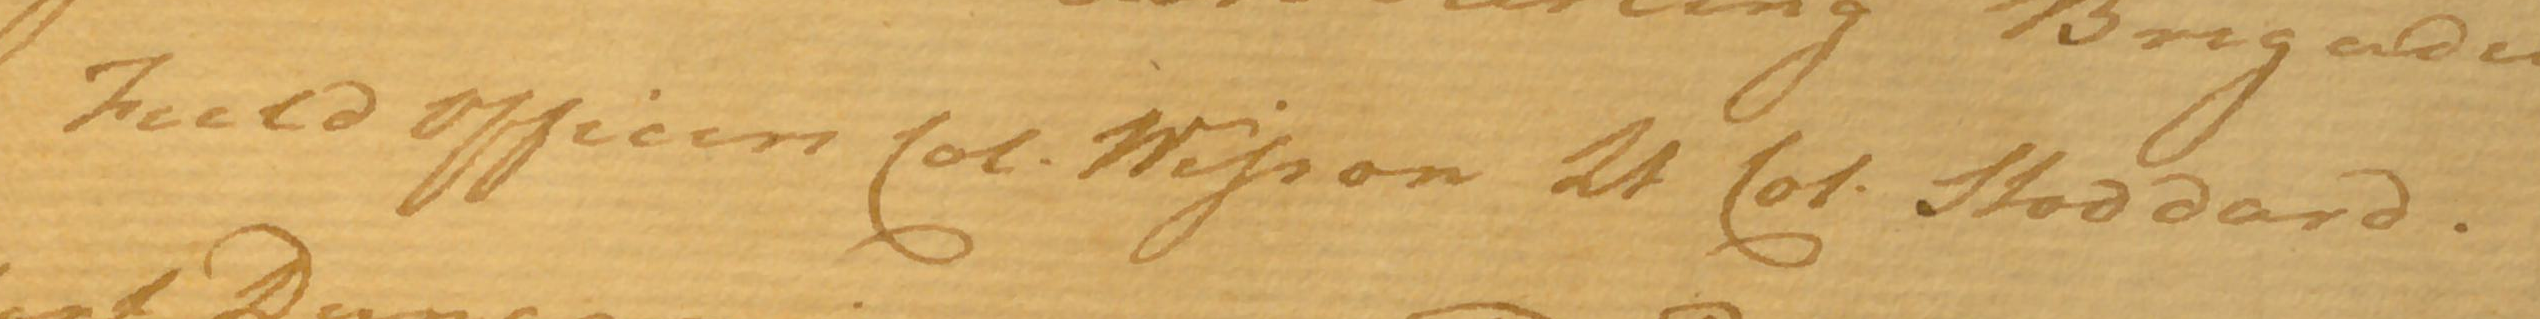Field Officers Col. Wilson Lt Col. Stoddard.
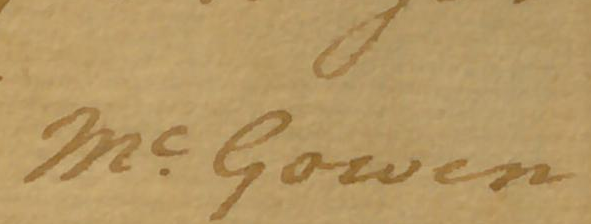M^c.Gowan
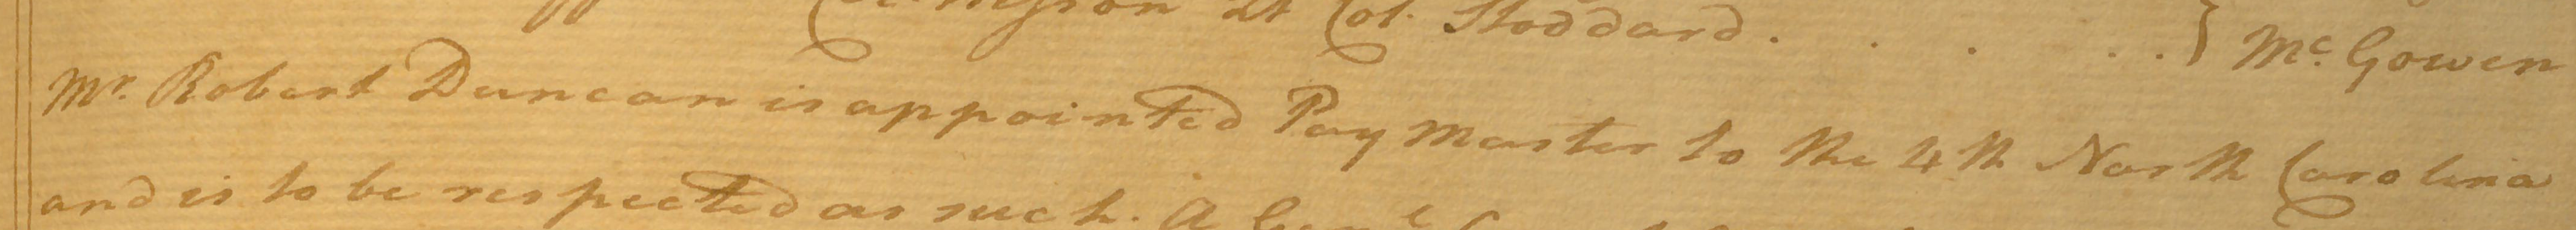M^r. Robert Duncan is appointed Pay master to the 4th North Carolina
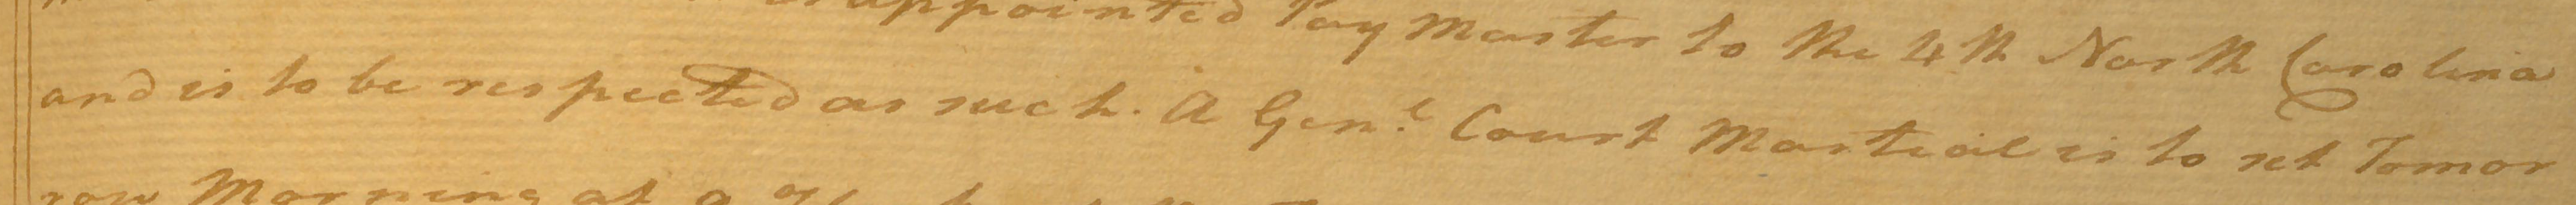and is to be respected as such. A Gen^l. court Martial is to set Tomor
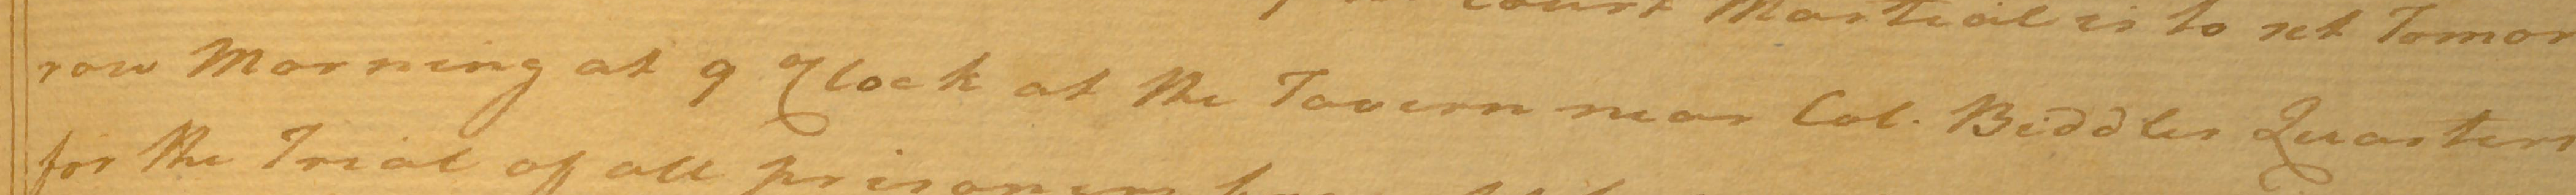row Morning at 9 ^oClock at the Tavern near Col. Biddels Quarters
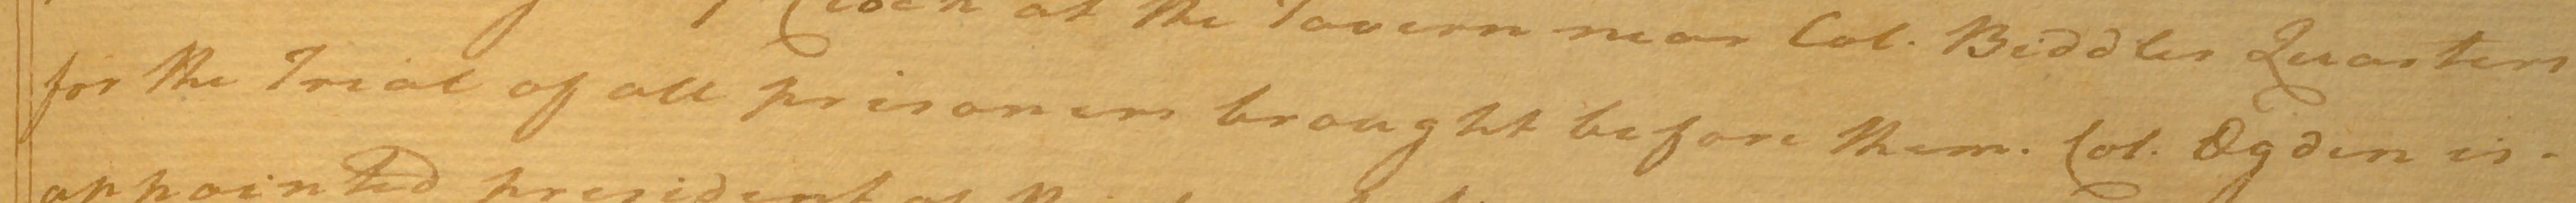for the Trial of all prisoners brought before them. Col. Ogden is-
